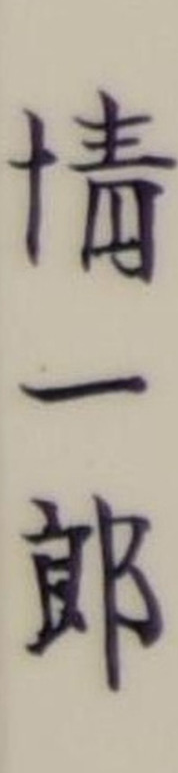情一郎

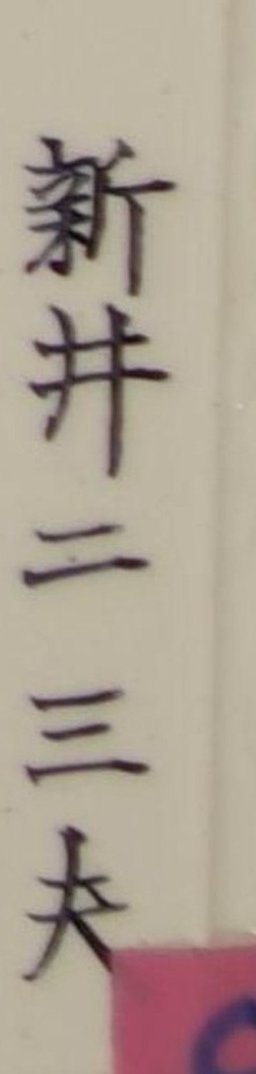新井二三夫
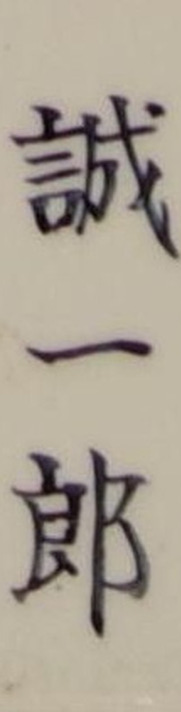誠一郎
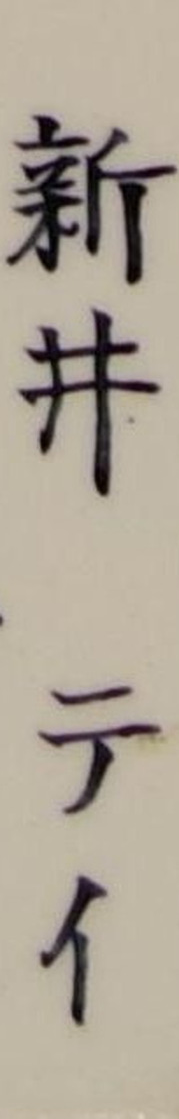新井テイ
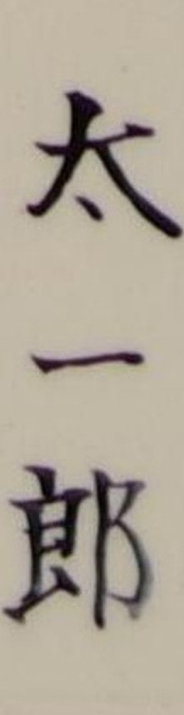太一郎
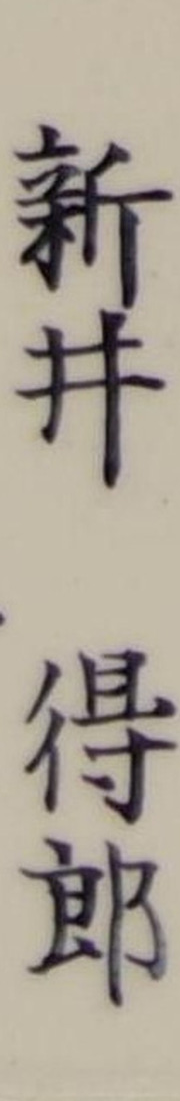新井得郎
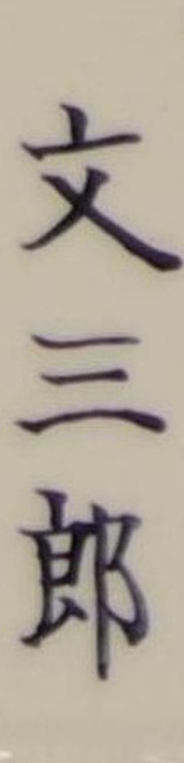文三郎
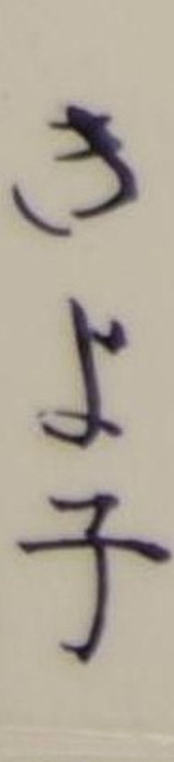きよ子

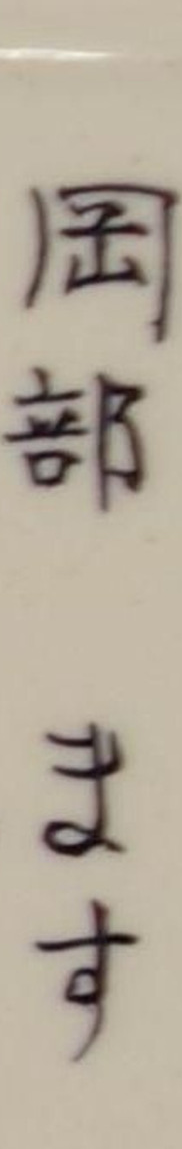岡部ます
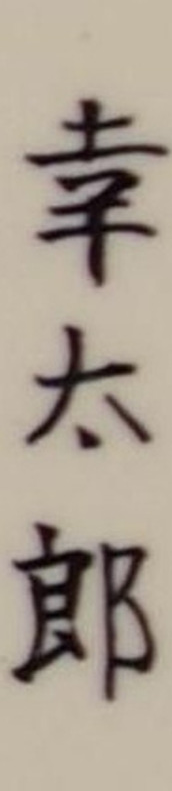幸太郎
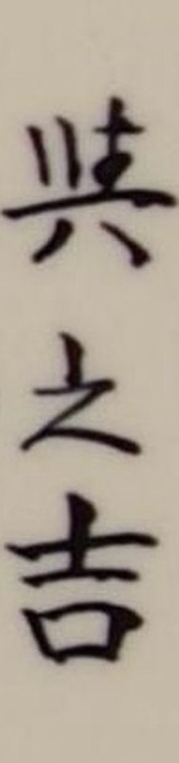与之吉
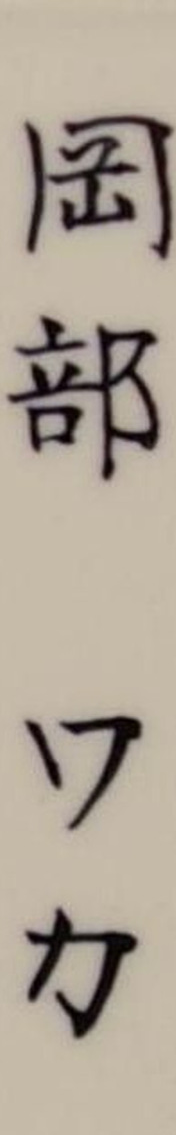岡部ワカ
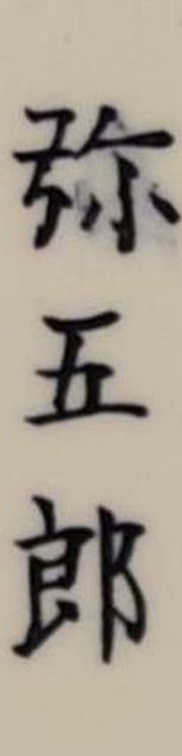弥五郎
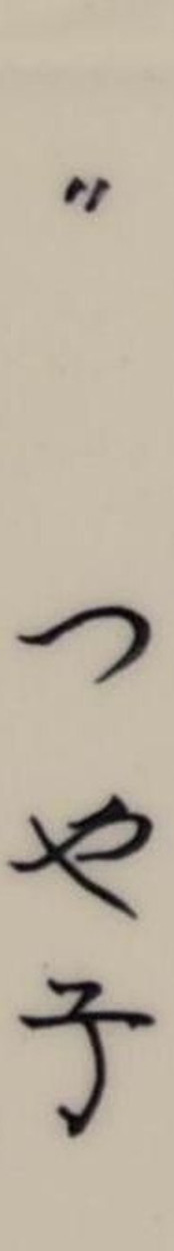つや子
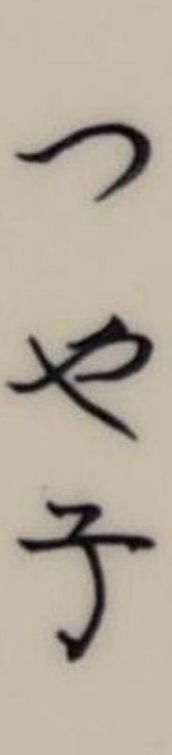つや子
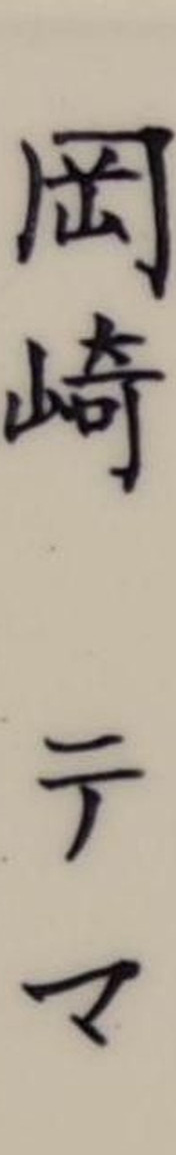岡崎テマ
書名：E~L
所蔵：高野山金剛峯寺
